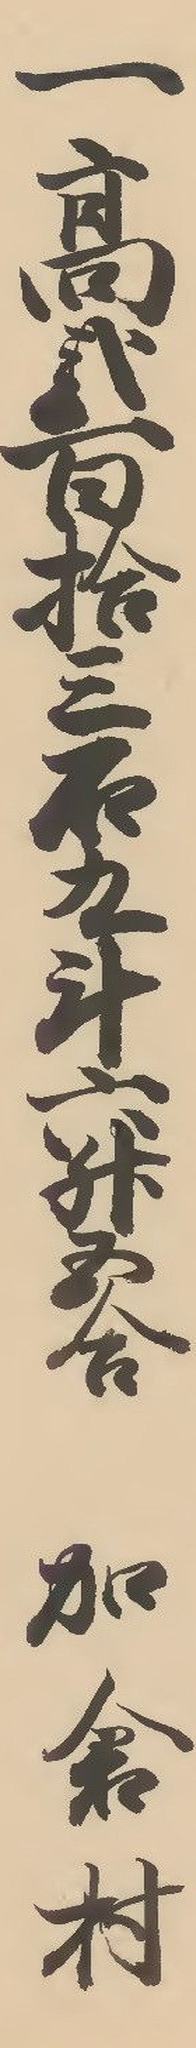一髙弐百拾三石九斗六升五合加倉村

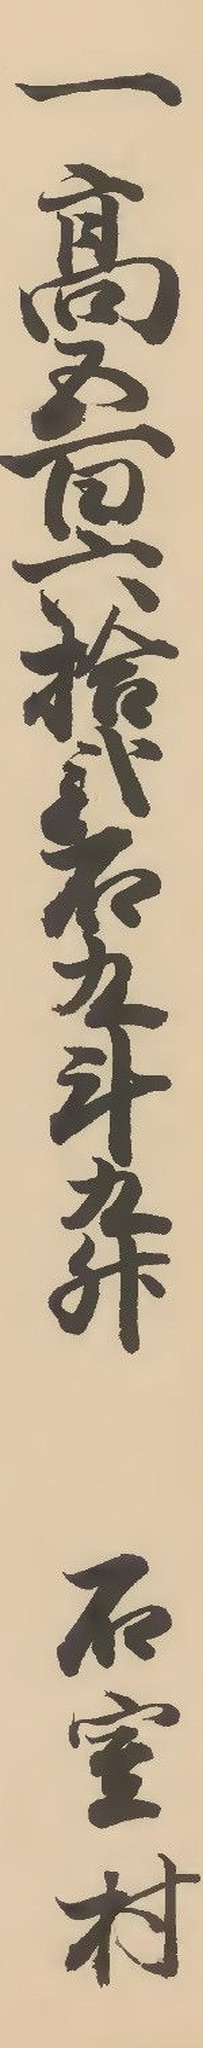一髙五百六拾弐石九斗九升石室村
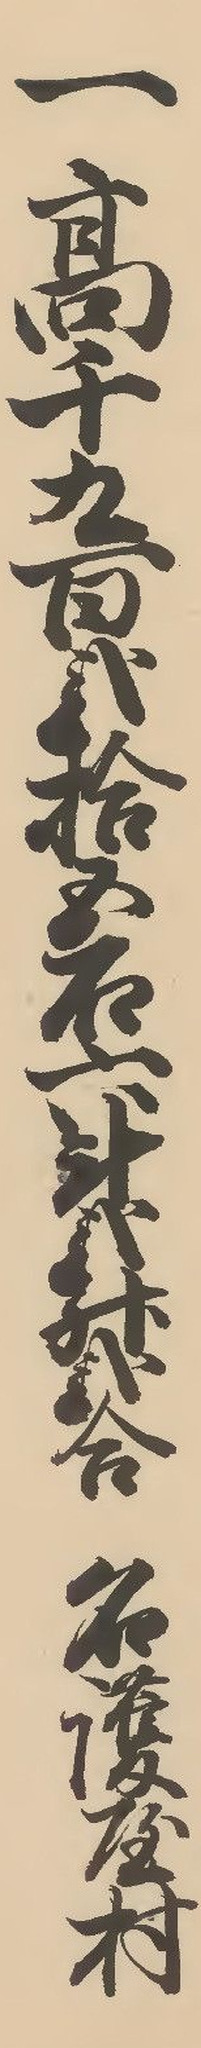一髙千九百弐拾五石六斗弐升弐合名護屋村
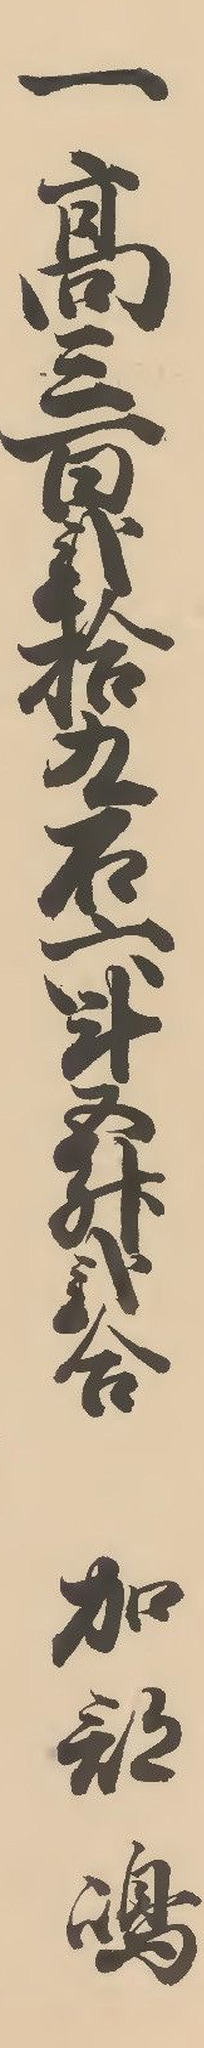一髙三百弐拾九石六斗五升弐合加部嶋
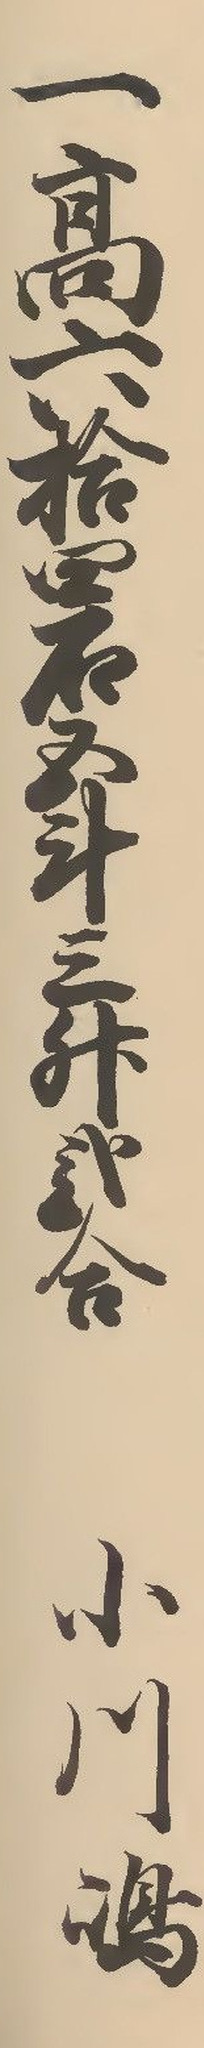一髙六拾四石五斗三升弐合小川嶋
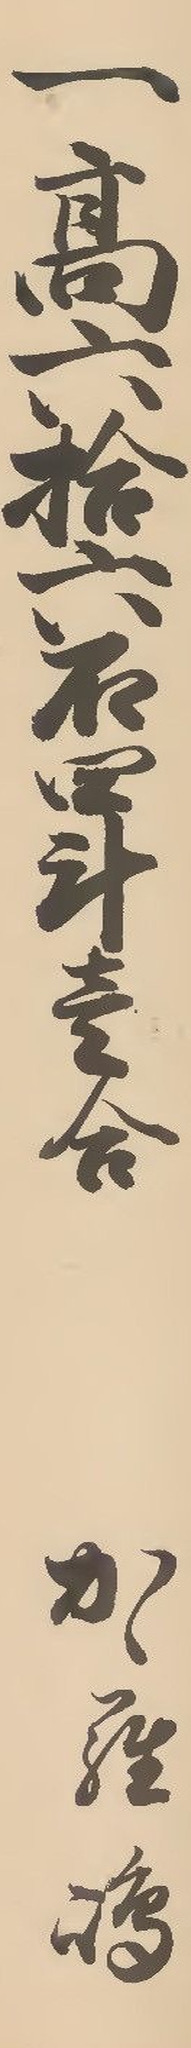一髙六拾六石四斗壱合加唐嶋
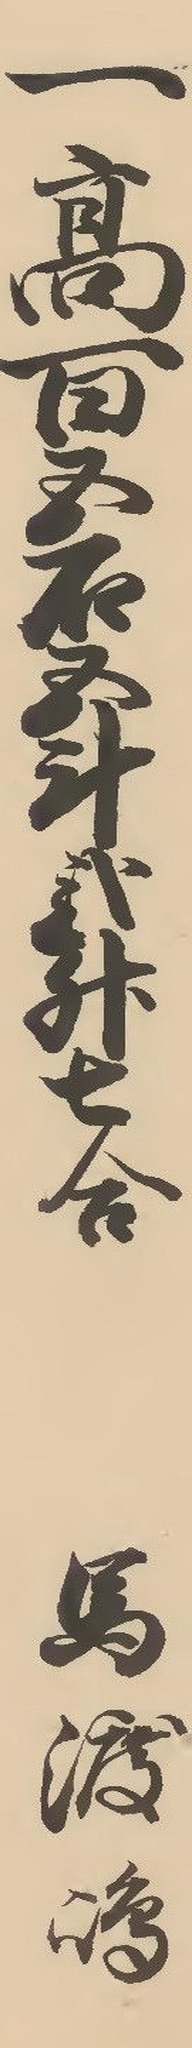一髙百五石五斗弐升七合馬渡嶋
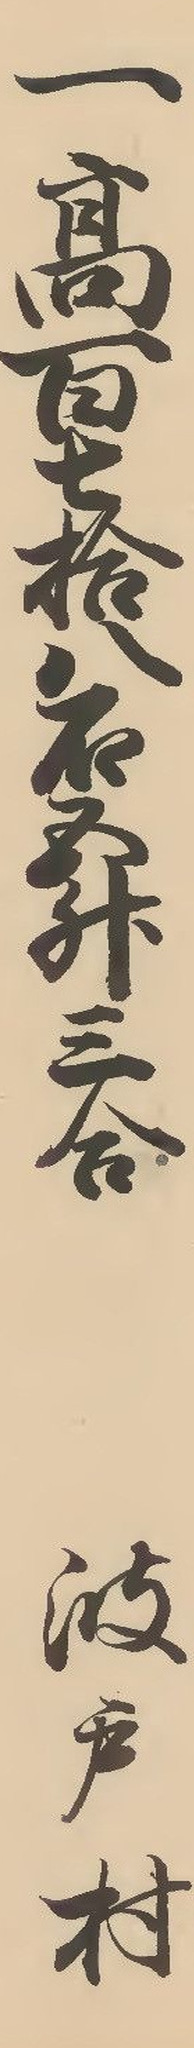一髙百七拾八石五升三合波戸村
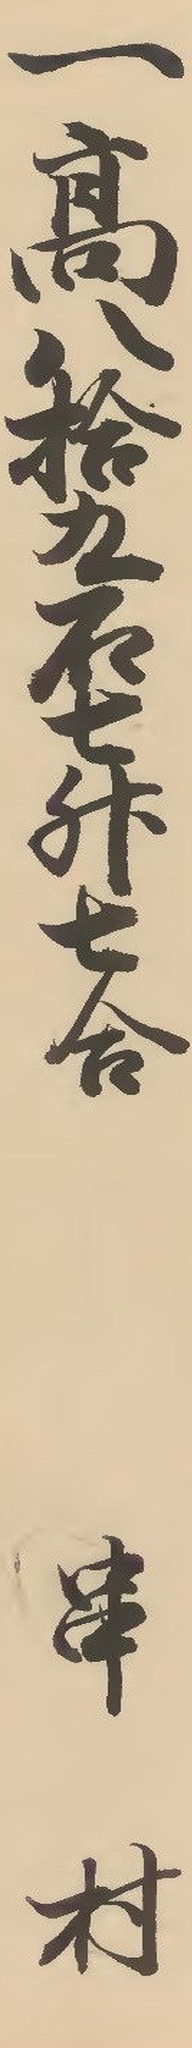一髙八拾九石七升七合串村

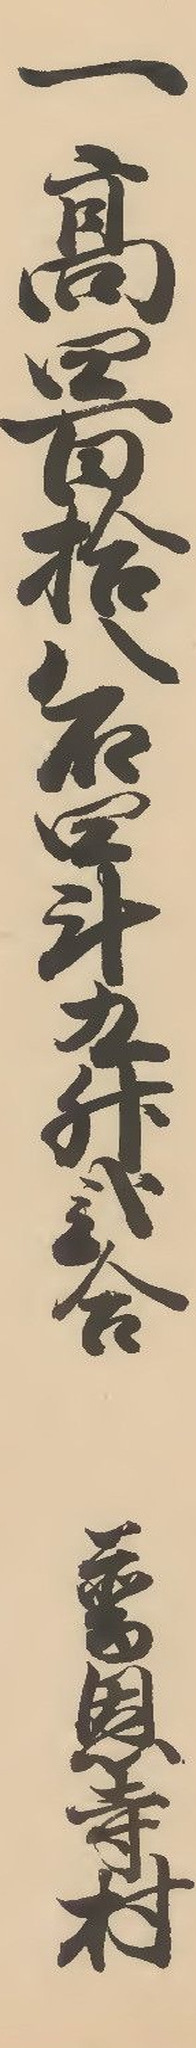一髙四百拾八石四斗九升弐合普恩寺村
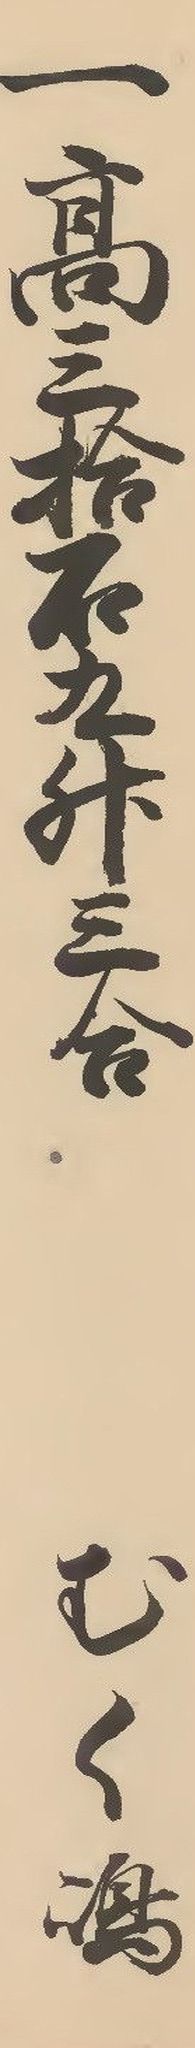一髙三拾石九升三合むく嶋
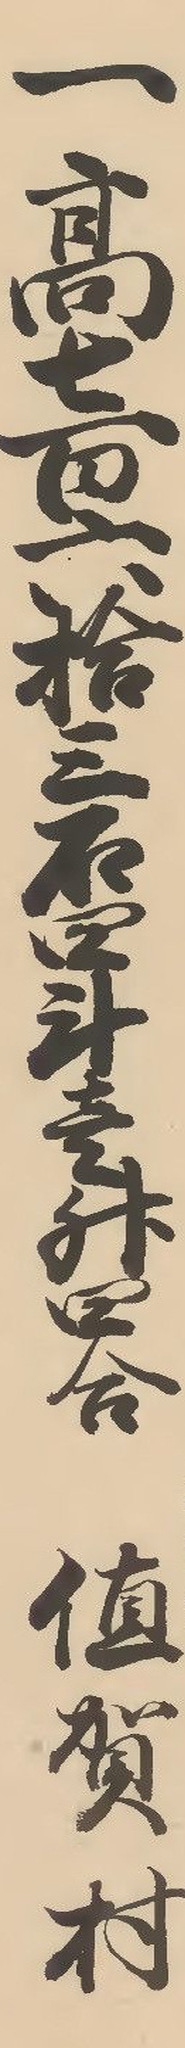一髙七百六拾三石四斗壱升四合値賀村
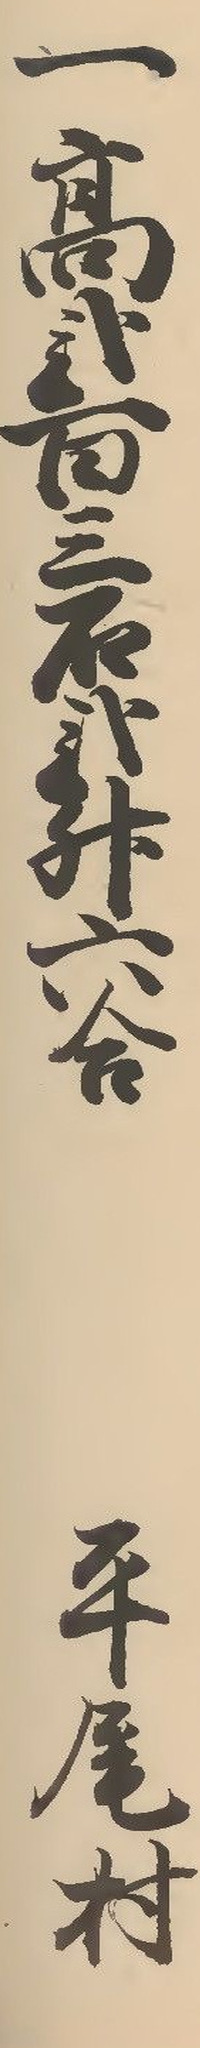一髙弐百三石弐升六合平尾村
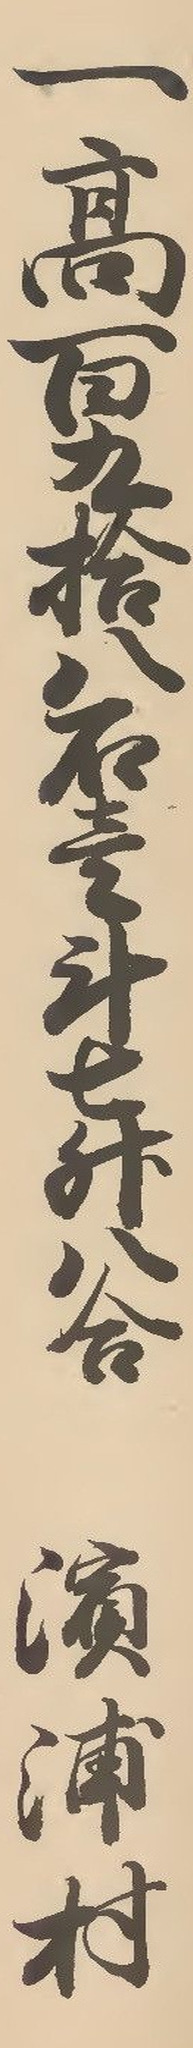一髙百九拾八石壱斗七升八合濱浦村
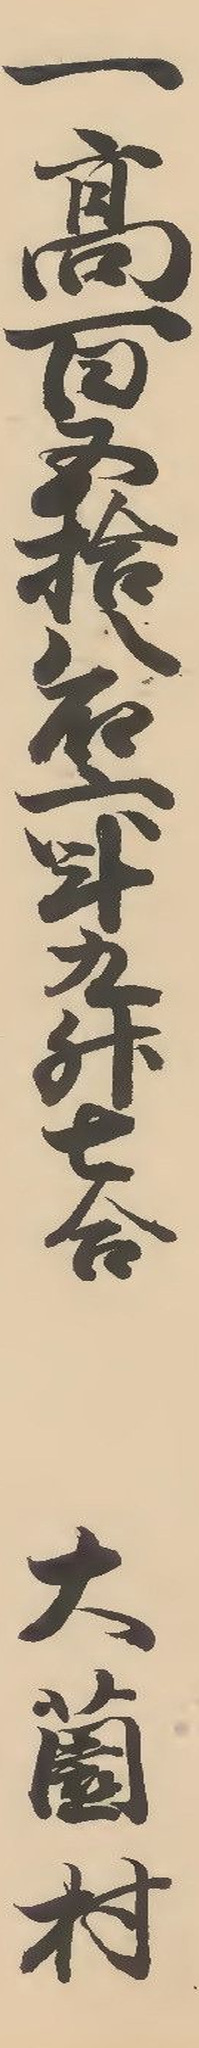一髙百五拾八石六斗九升七合大薗村
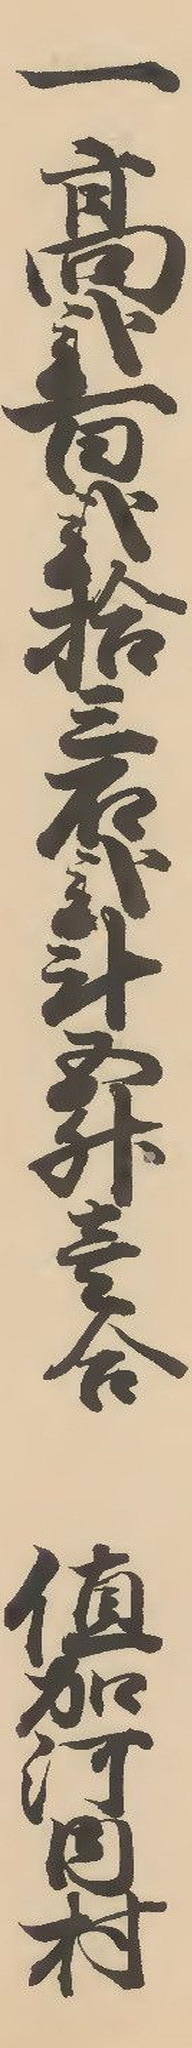一髙弐百弐拾三石弐斗五升壱合値加河内村
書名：肥前国郷帳
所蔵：国立公文書館 National Archives of Japan
